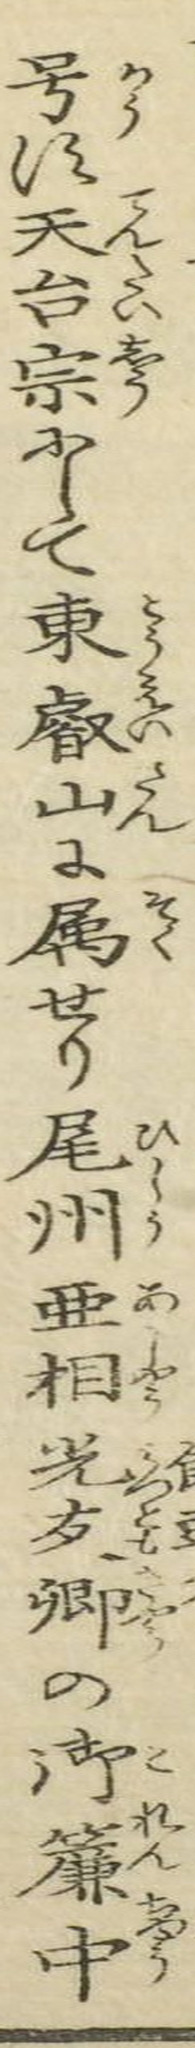号す天台宗にして東叡山に属せり尾州亜相光友卿の御簾中
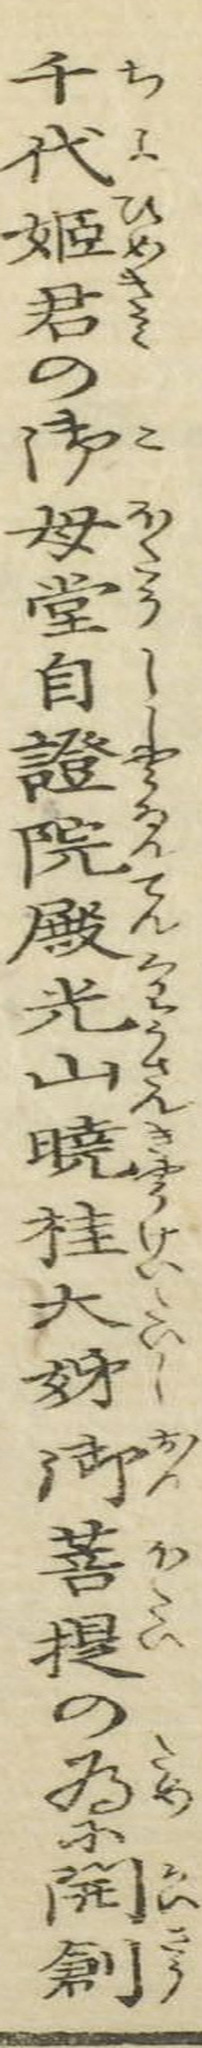千代姫君の御母堂自証院殿光山暁桂大姉御菩提の為に開創
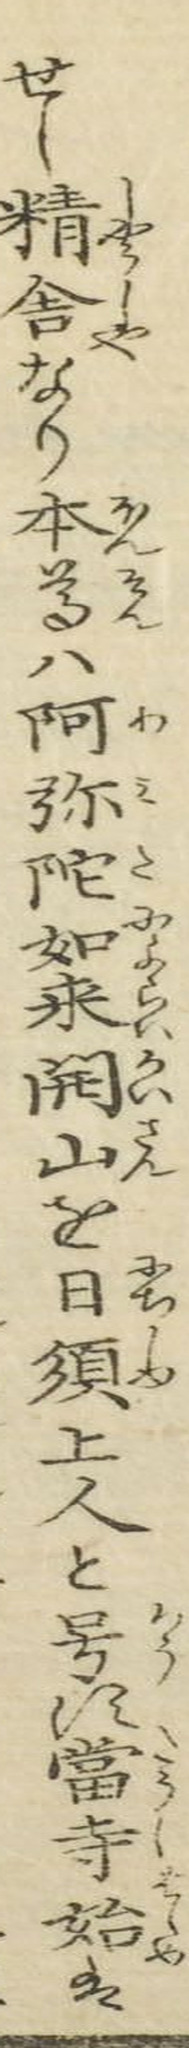せし精舎なり本尊は阿弥陀如来開山を日須上人と号す当寺始は
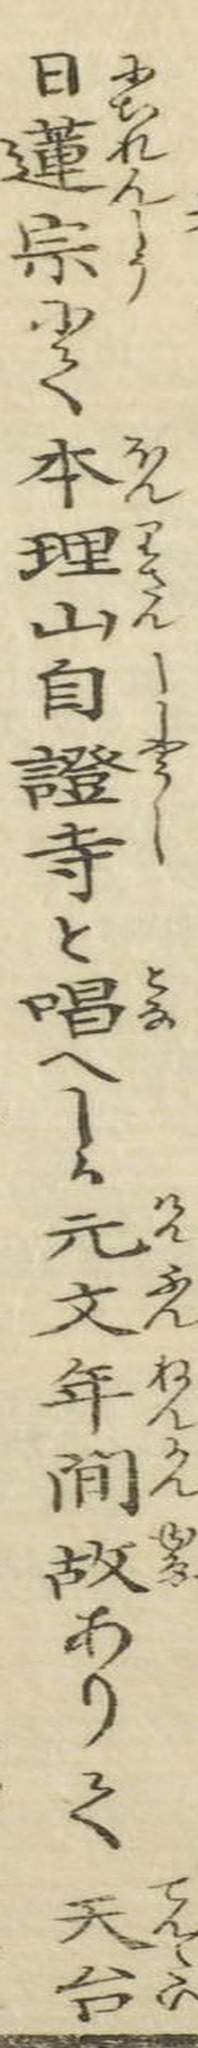日蓮宗にて本理山自証寺と唱へしか元文年間故ありて天台
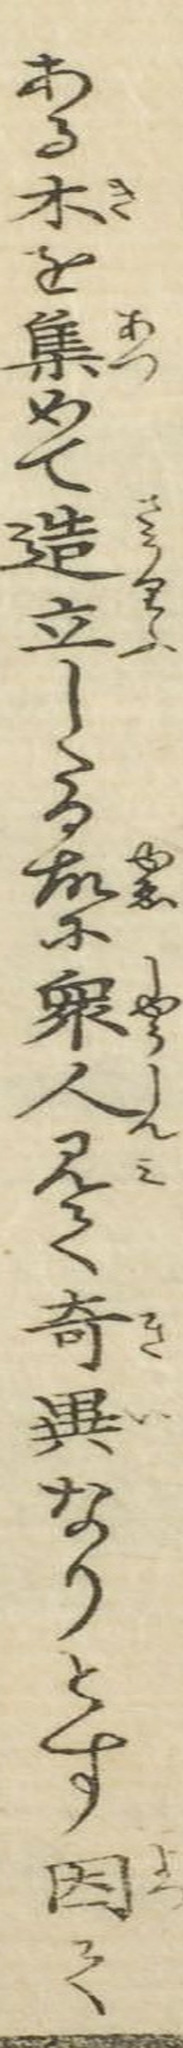ある木を集めて造立したる故に衆人見て奇異なりとす因て

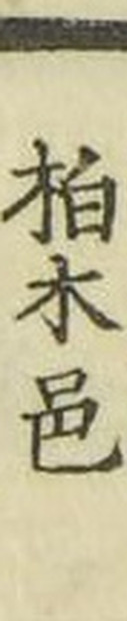柏木邑
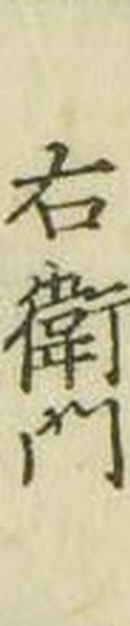右衛門
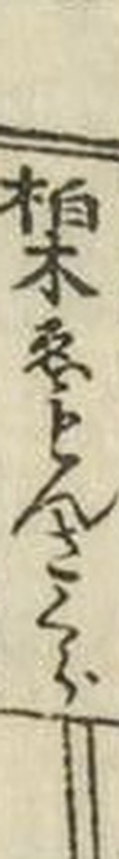柏木ゑもんさくら
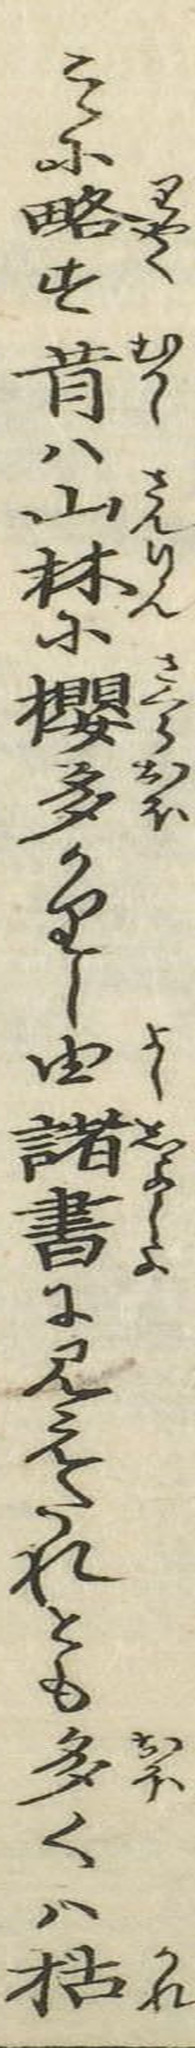こゝに略す昔は山林に桜多かりし由諸書に見えたれとも多くは枯
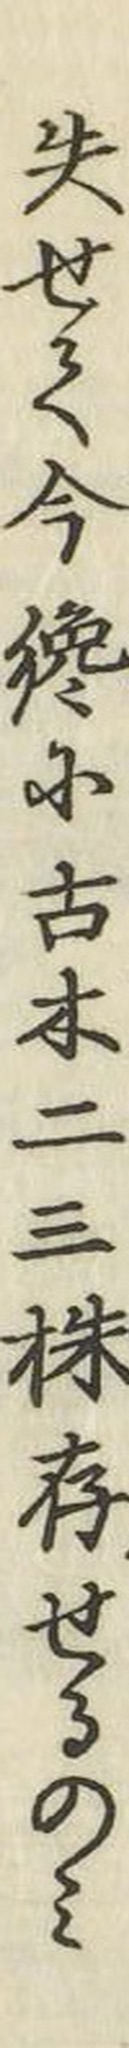失せて今纔に古木二三株存せるのみ
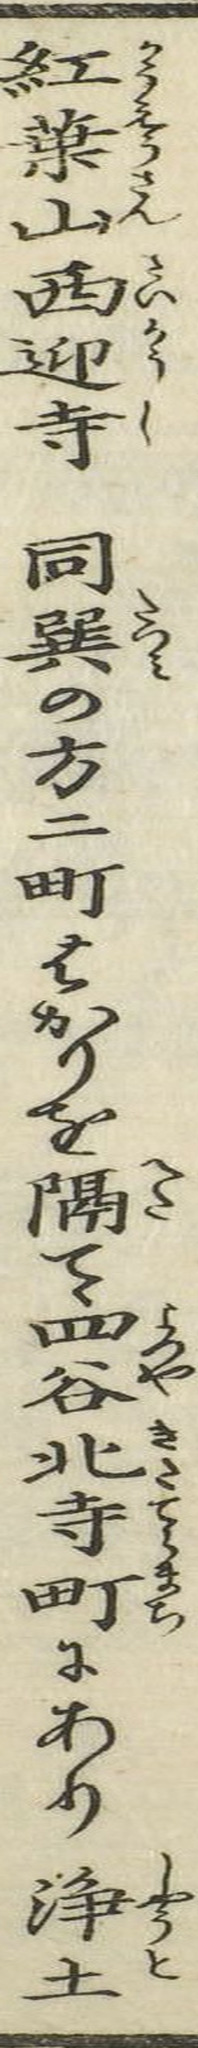紅葉山西迎寺同巽の方二町はかりを隔てゝ四谷北寺町にあり浄土
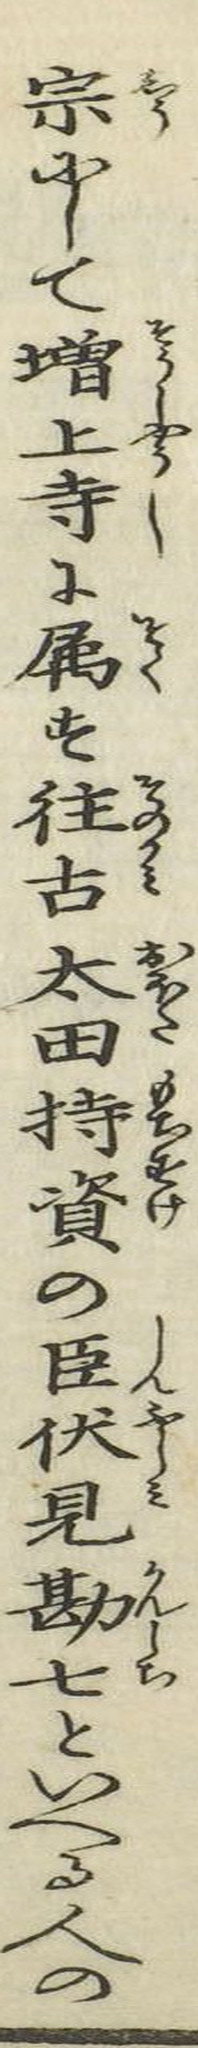宗にして増上寺に属す往古太田持資の臣伏見勘七といへる人の
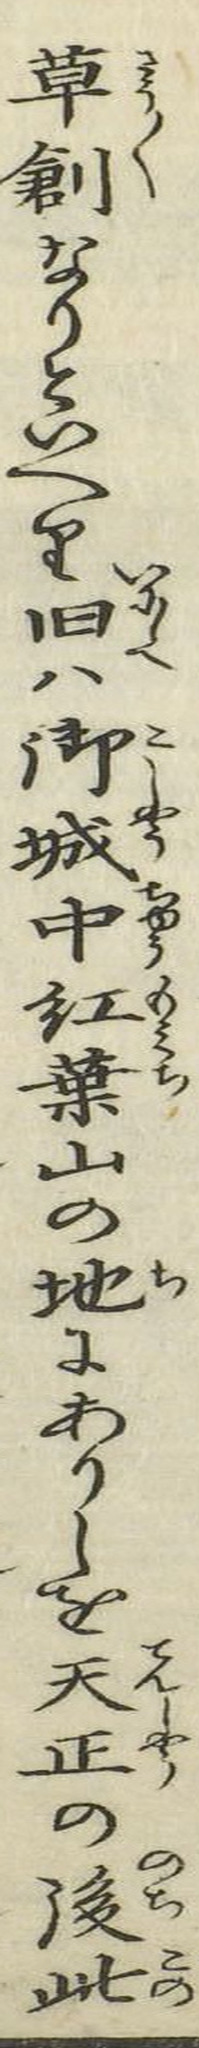草創なりといへり旧は御城中紅葉山の地にありしを天正の後此
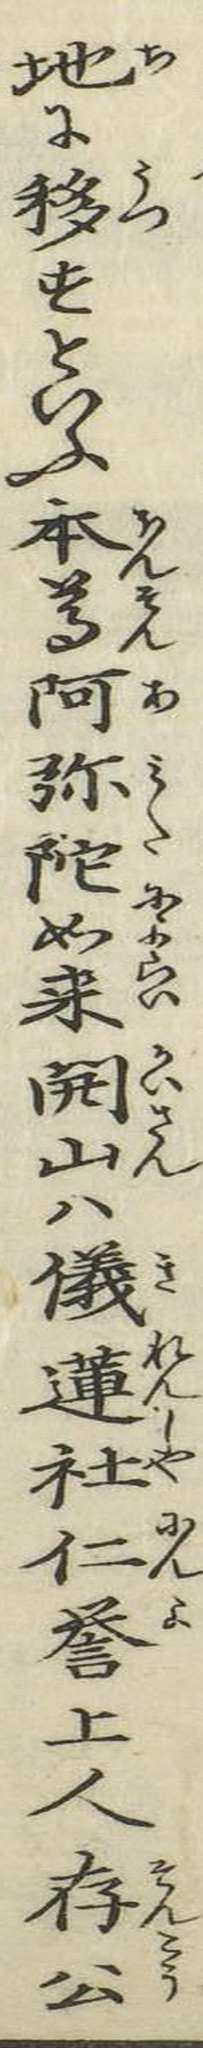地に移すといふ本尊阿弥陀如来開山は儀蓮社仁誉上人存公
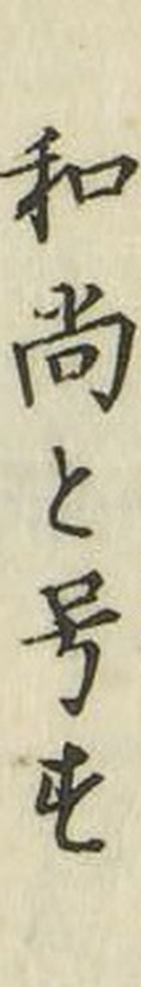和尚と号す
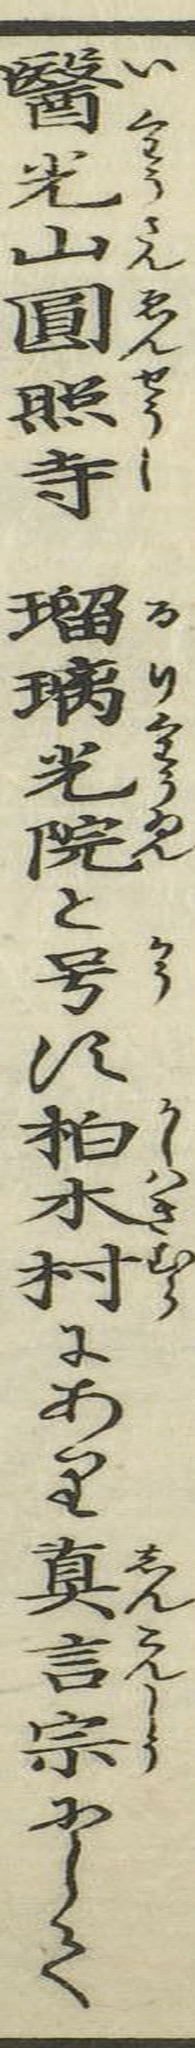医光山円照寺瑠璃光院と号す柏木村にあり真言宗にして
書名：江戸名所図会 20巻 巻之11
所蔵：東京学芸大学教育コンテンツアーカイブ
